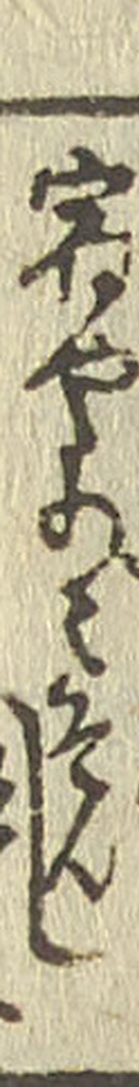宿や少〻そんし
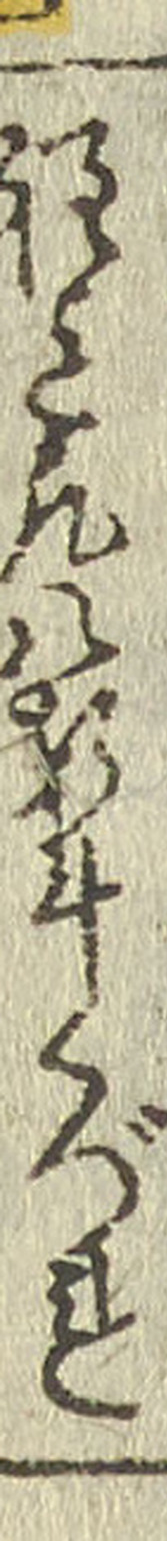程迄凢八軒斗くづれ
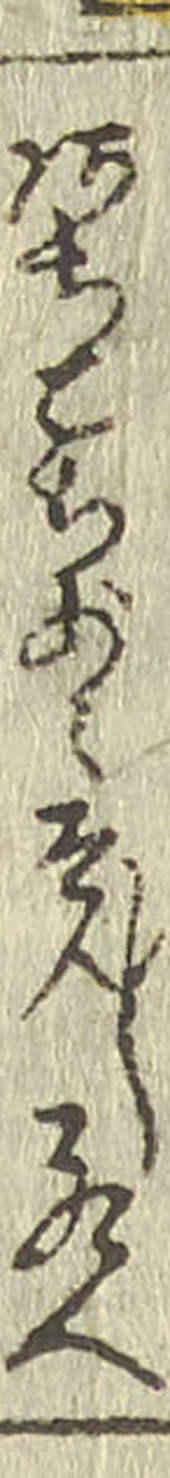あちこち少々そんし死人
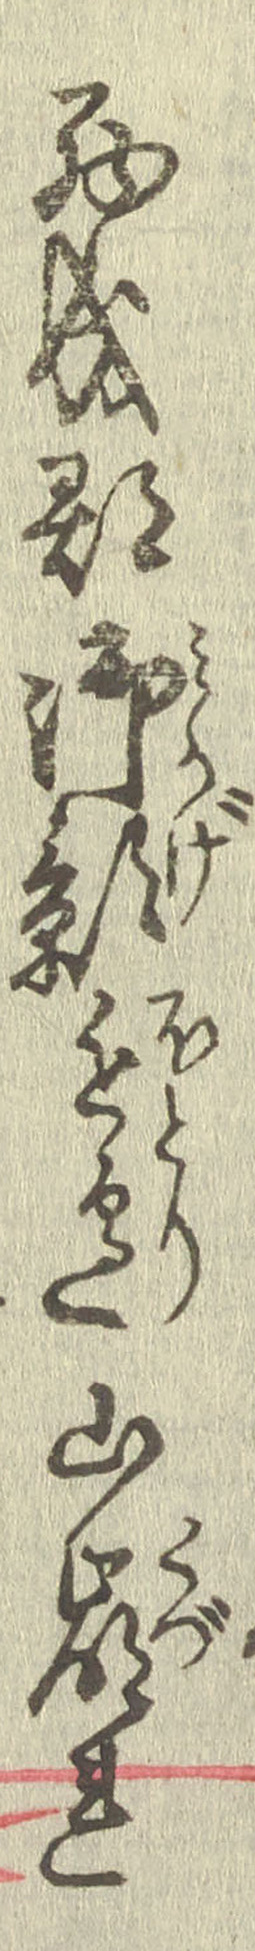西成郡御影近邊山崩れ
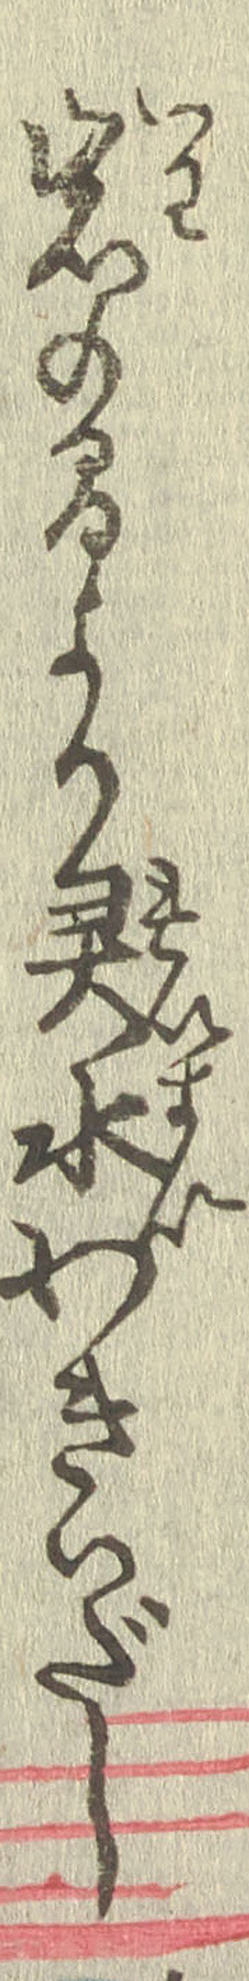岩の間より㚑水わきいだし
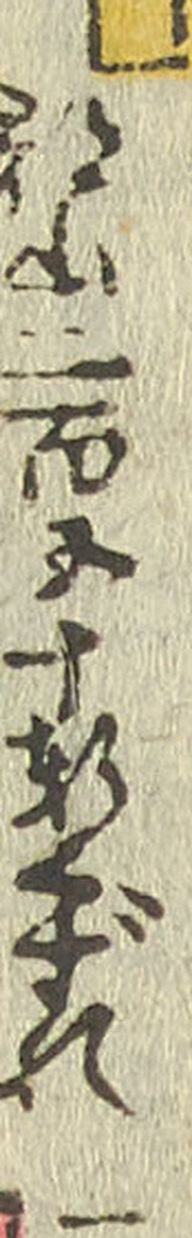郡山二百五十軒くずれ
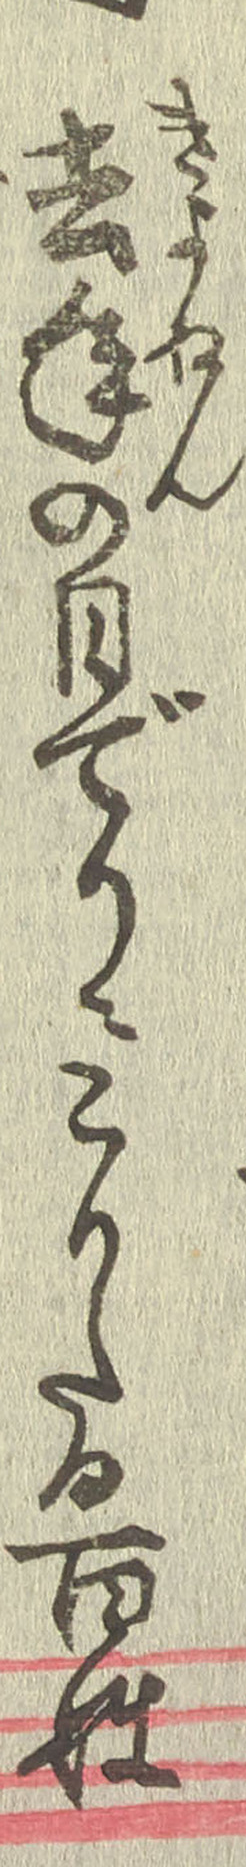去年の日でりニこりたる百姓
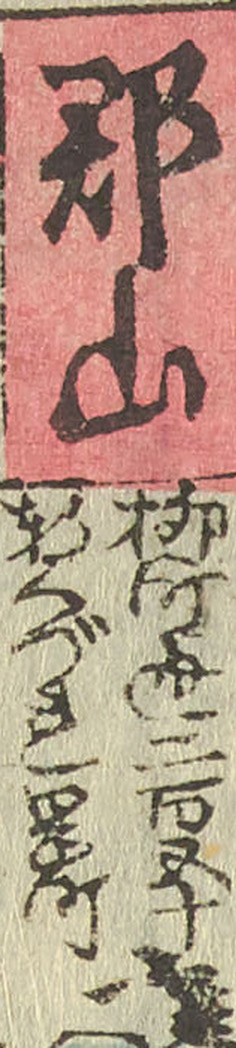軒くづれ岡町
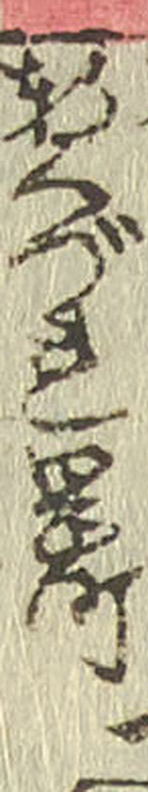軒くづれ岡町
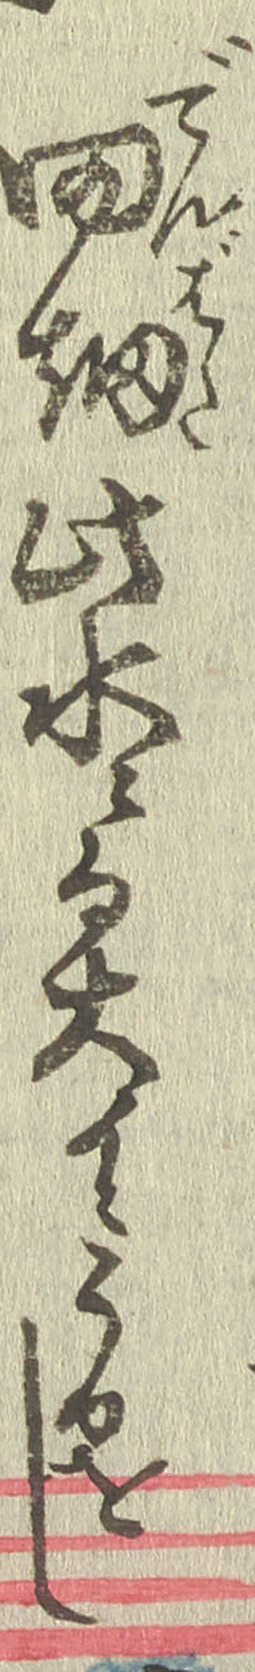田畑此水ニ而大イニうるをし
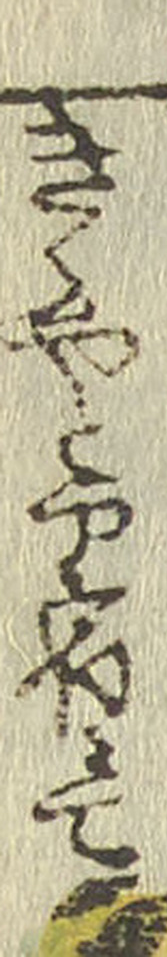きくやとや宿ニて
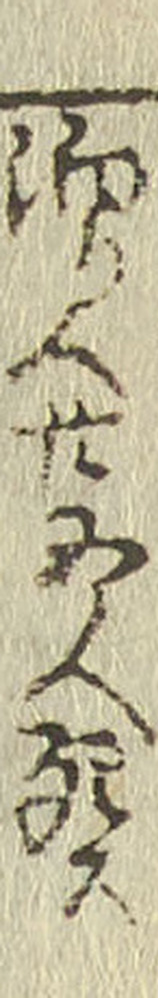泊り人廿五人死す
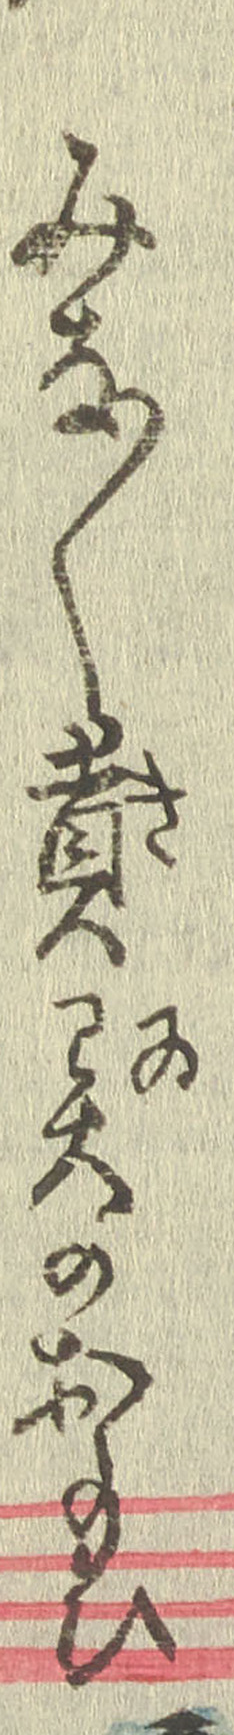みな〳〵貴異のおもひ
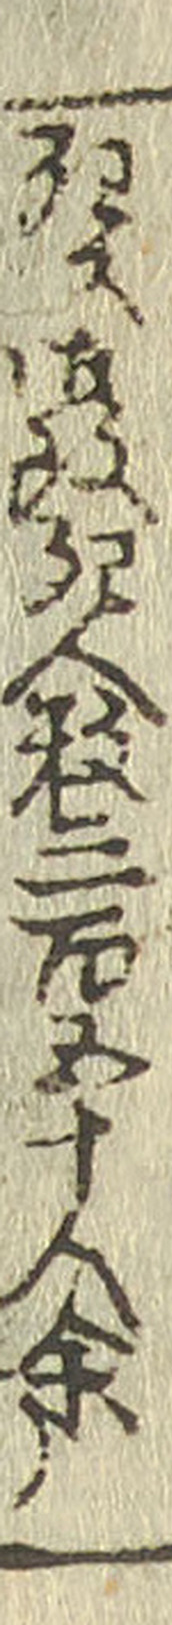死ス御改死人数三百五十人余
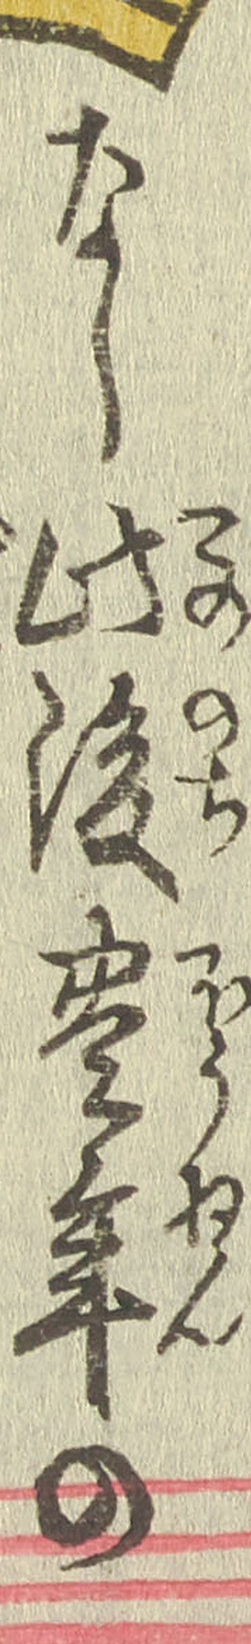なし此後豊年の
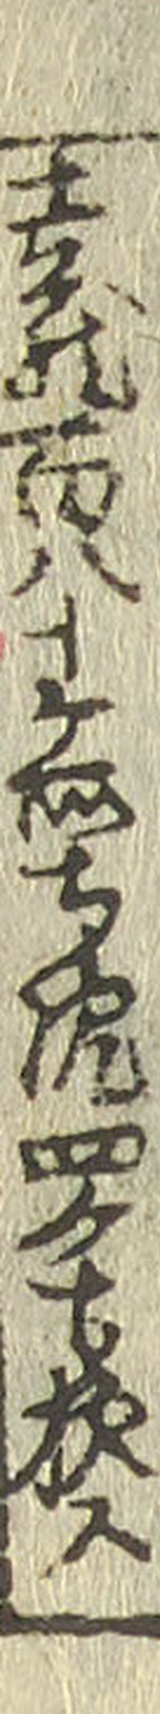土蔵百八十ヶ所寺院四ヶ寺損ス
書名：大地震早引方角附
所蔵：東京大学総合図書館 General Library in the University of Tokyo, JAPAN
